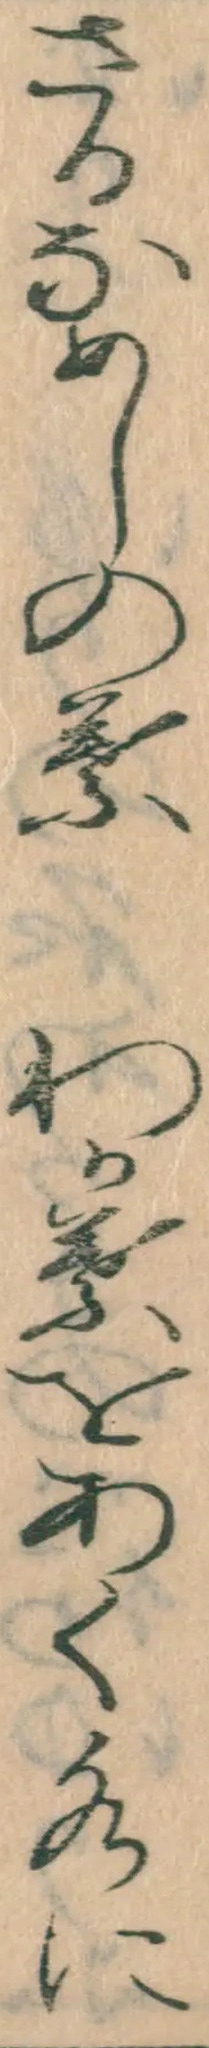さるなめしの葉わか葉をあく水に
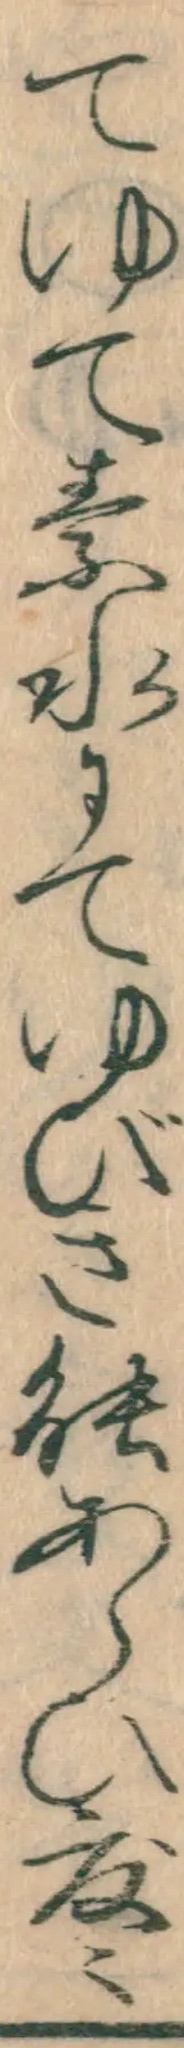てゆて素水にてゆびき能あらひ度々
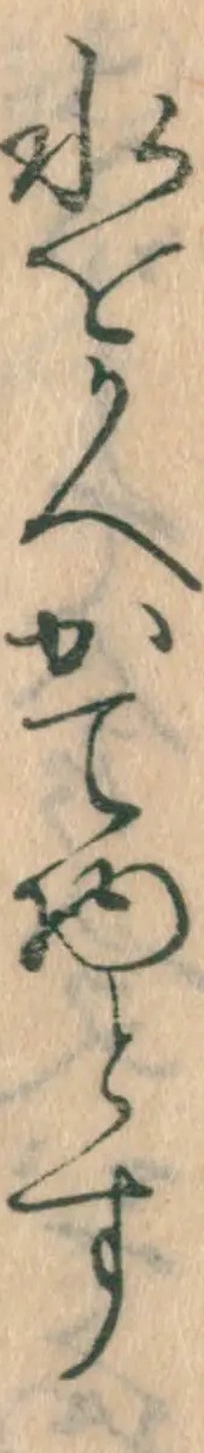水をかへかて物とす

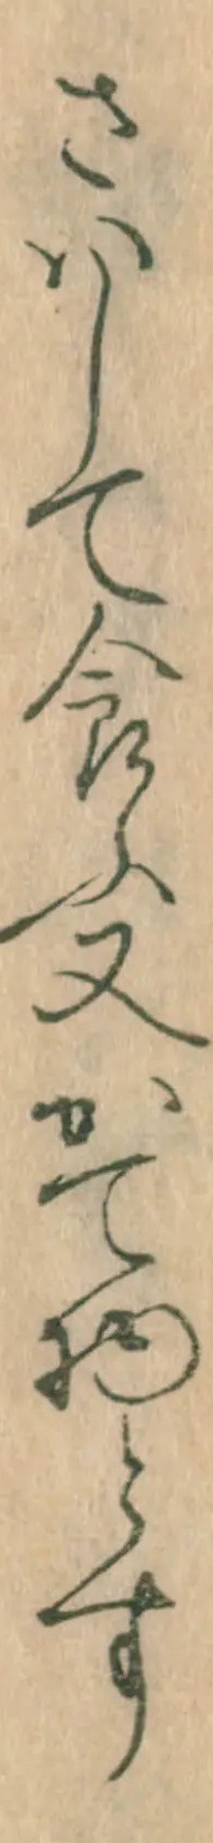さはして食ふ又かて物とす
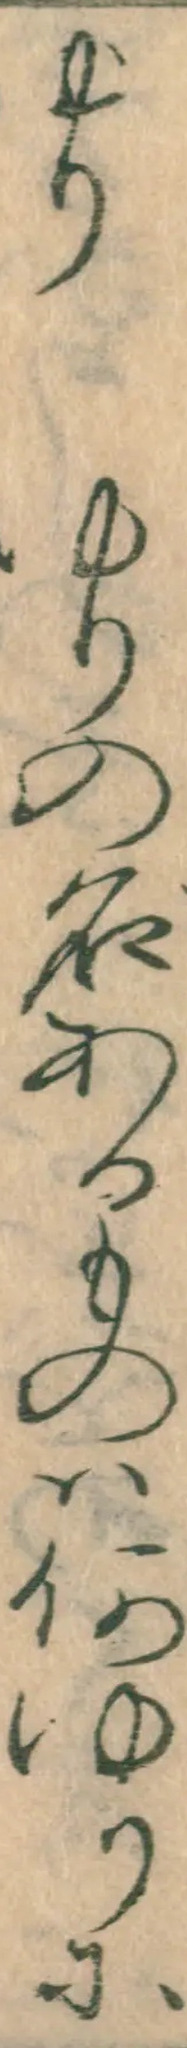ゆりゆりの名あるものは何ゆりに
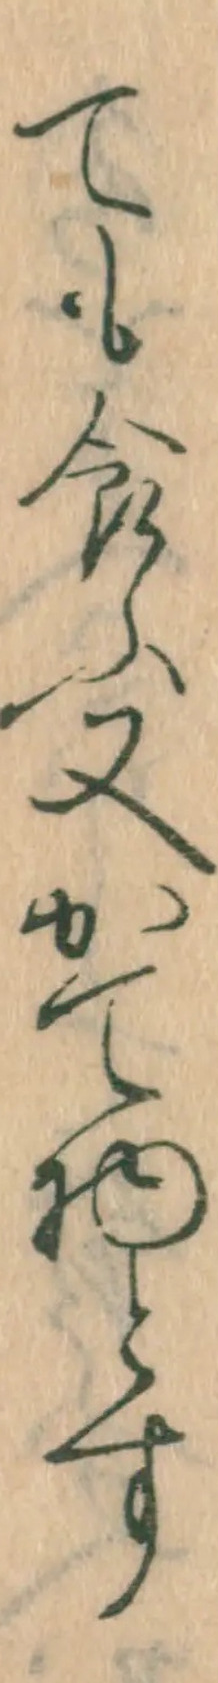ても食ふ又かて物とす
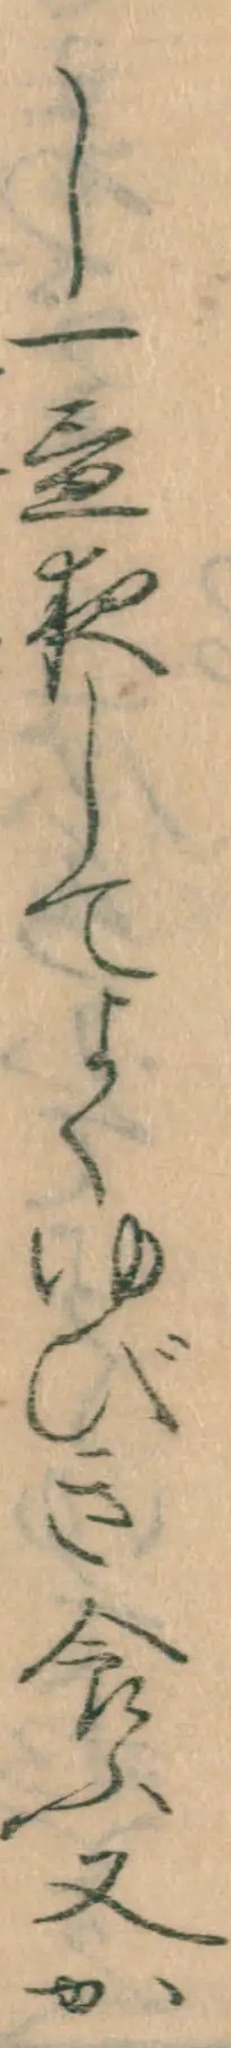し一昼夜してよくゆびき食ふ又か
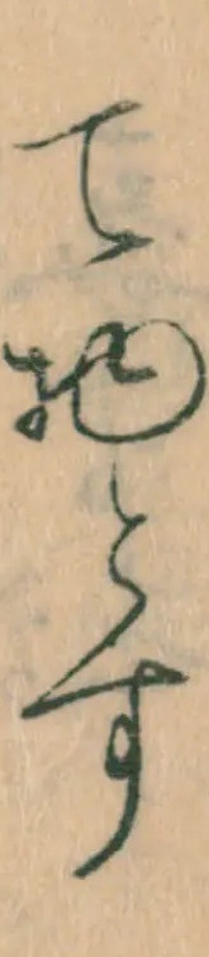て物とす
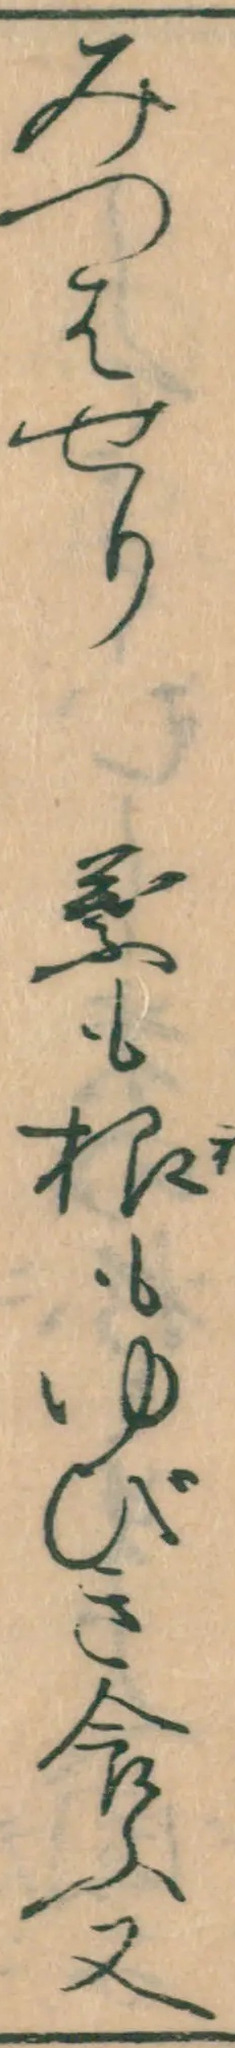みつはせり葉も根もゆびき食ふ又
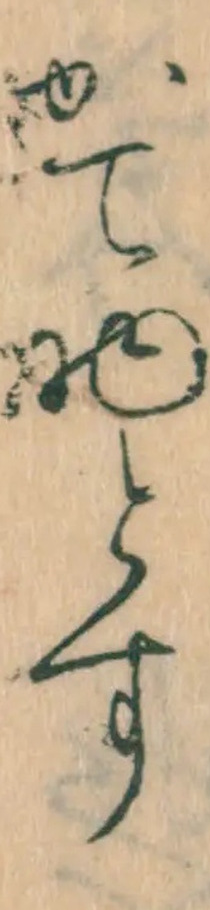かて物とす
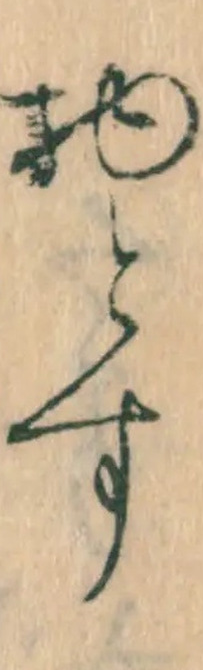物とす
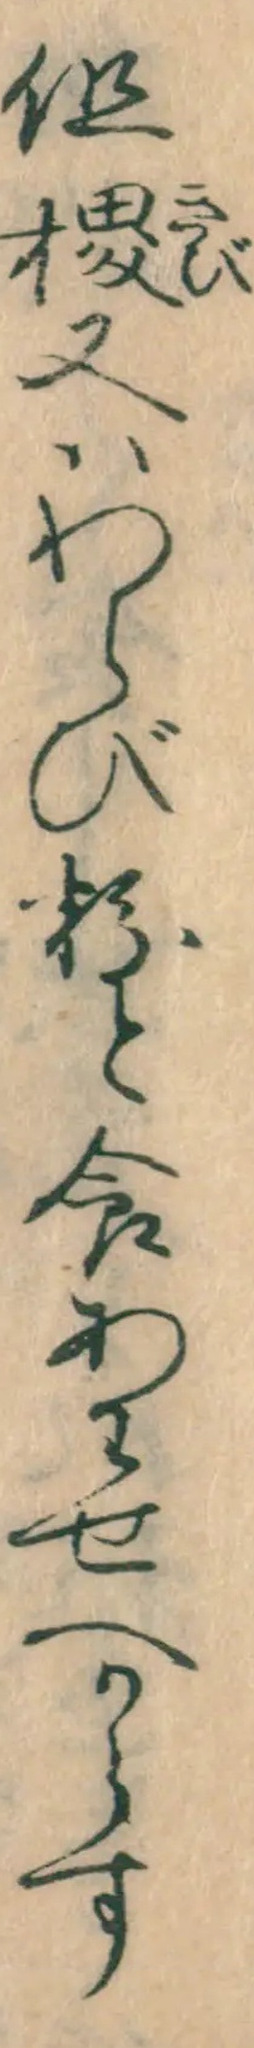但稷又はわらび粉と食あわせへからす

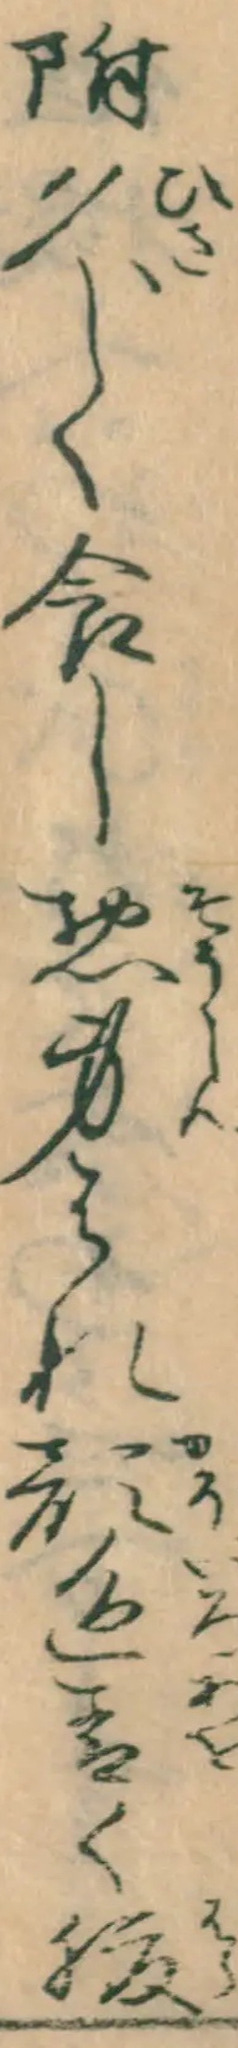附久しく食し惣身はれ顔色青く腹
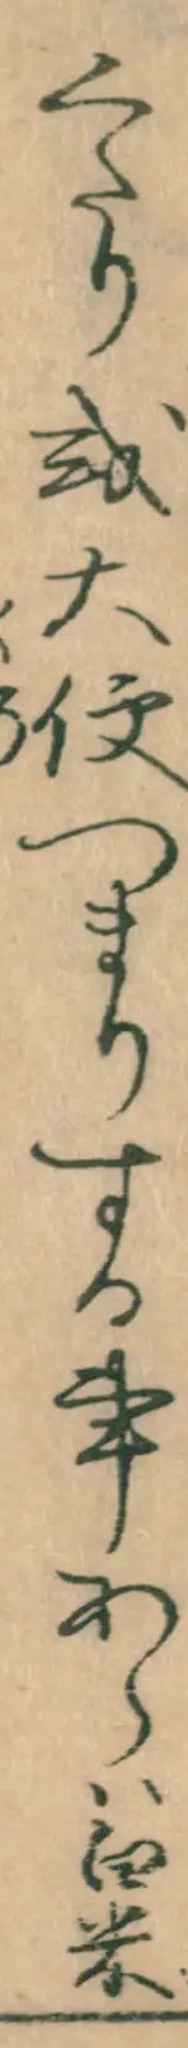くたり或大便つまりする事あらは白米
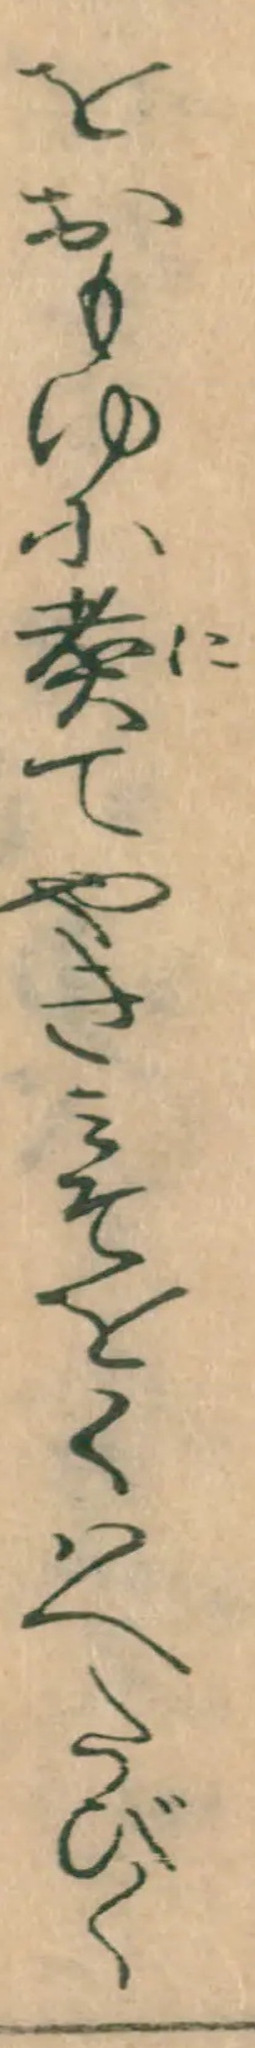をおもゆに煮てやきみそをくはへたび〳〵
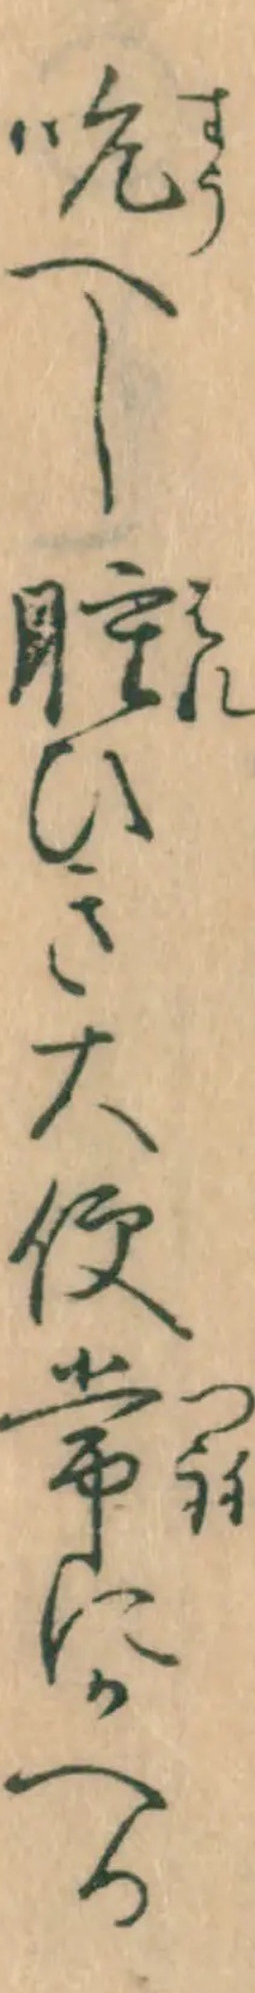吮へし腫ひき大便常にかへる
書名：かてもの
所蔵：国立国会図書館 National Diet Library, JAPAN
